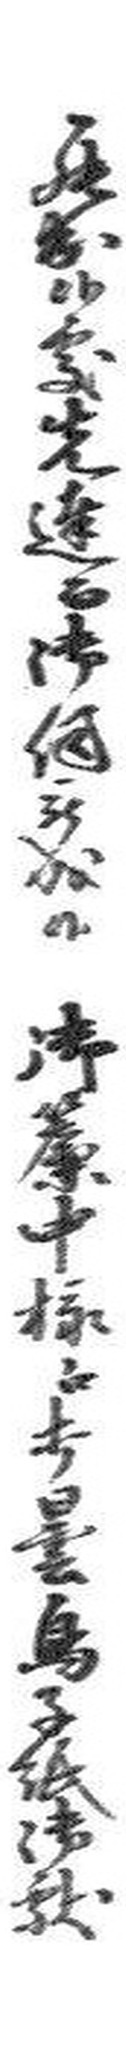罷出候処先達而御伺被成候御簾中様江打曇鳥子紙御献
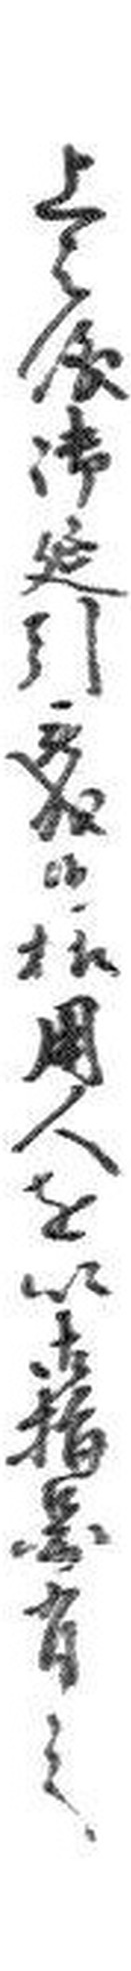上之儀御延引被成候様用人を以御指図有之
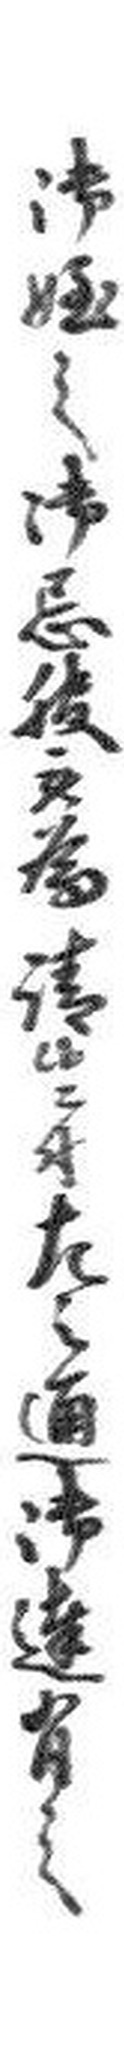御姪之御忌服被為請候ニ付左之通御達有之

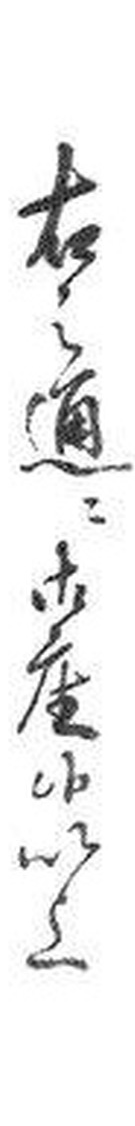右之通ニ御座候以上
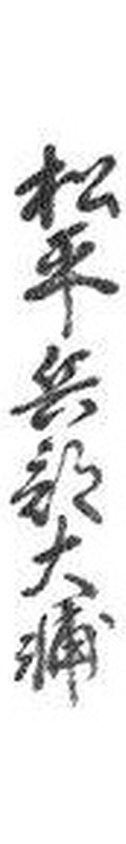松平兵部大輔殿
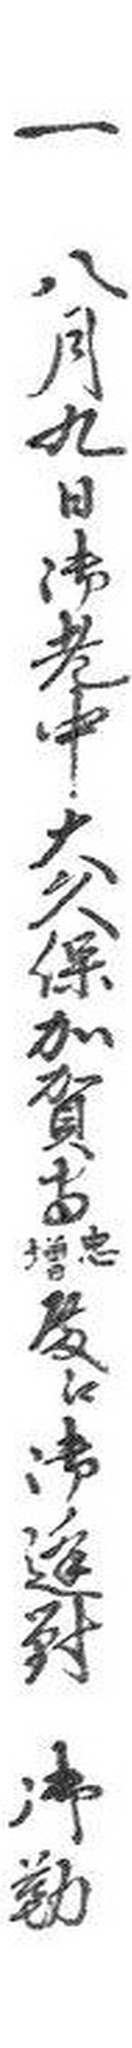一八月九日御老中大久保加賀守忠増殿江御逢対御勤
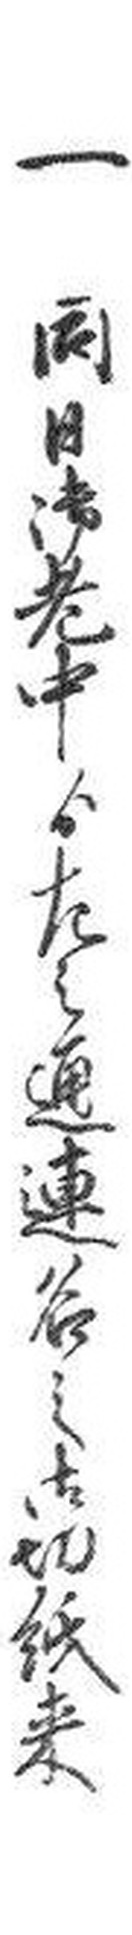一同日御老中ゟ左之通連名之御切紙来
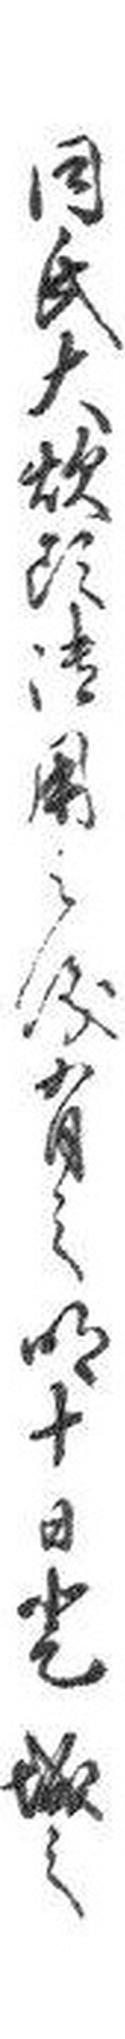同氏大炊頭御用之儀有之明十日登城之
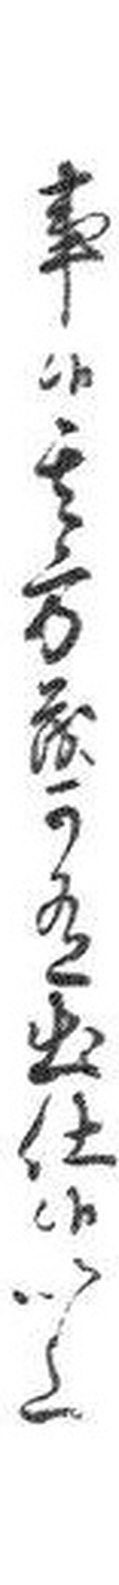事候其方も可有出仕候以上
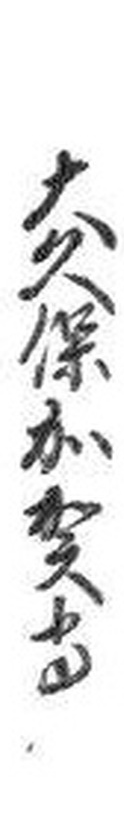大久保加賀守
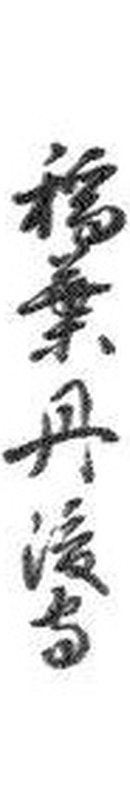稲葉丹後守
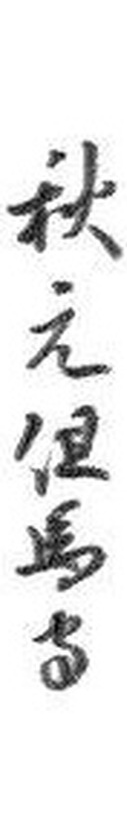秋元但馬守
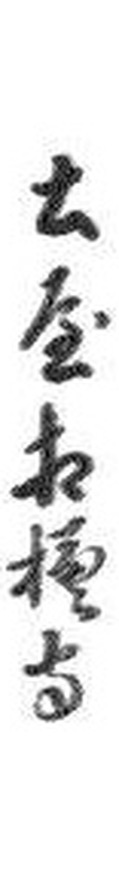土屋相模守
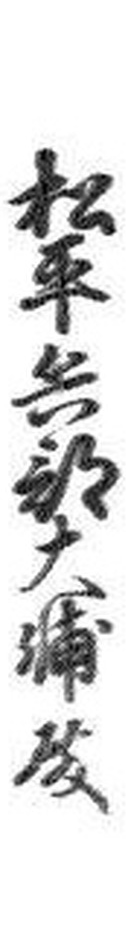松平兵部大輔殿
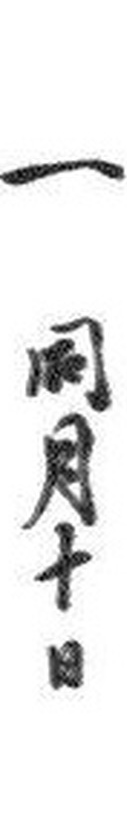一同月十日
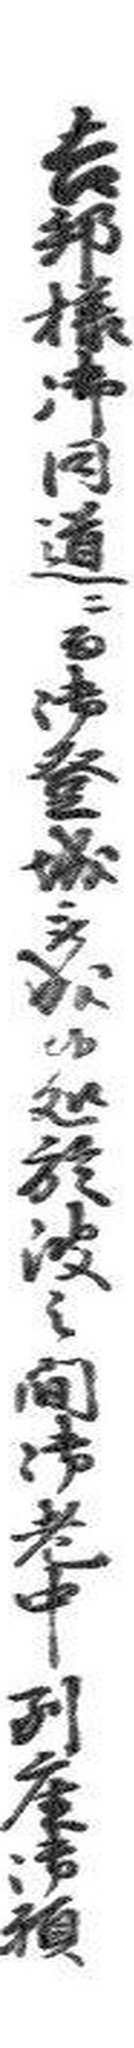吉邦様御同道ニ而御登城被成候処於波之間御老中列座御願
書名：家譜 二十四 吉品公 従宝永三年到同五年
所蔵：福井県文書館 Fukui Prefectural Archives
